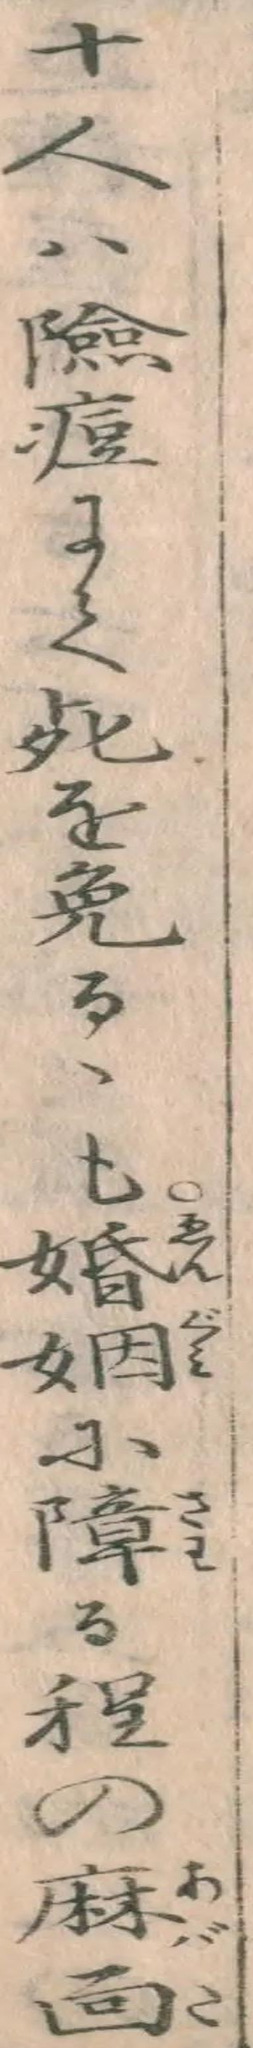十人は険痘にて死を免るゝも。婚姻に障る程の麻面
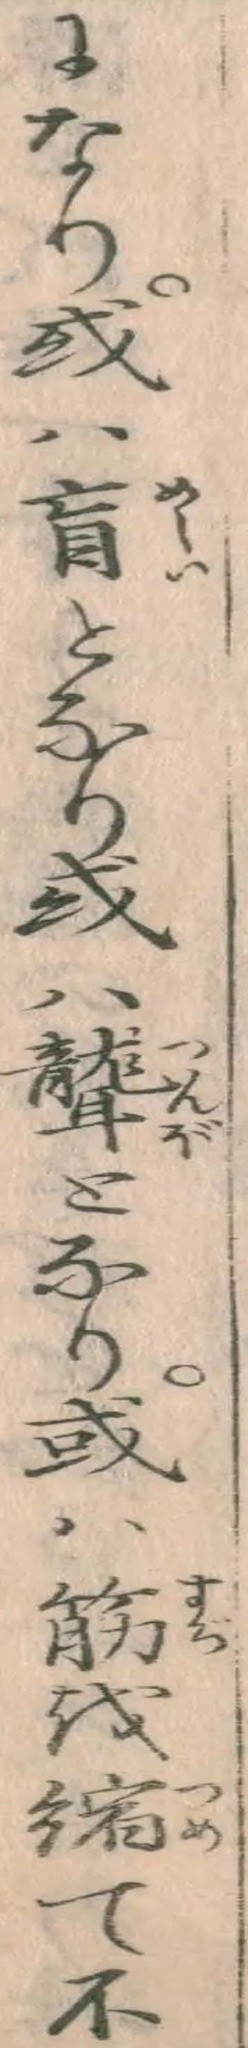になり。或は盲となり或は聾となり。或は筋を縮て不
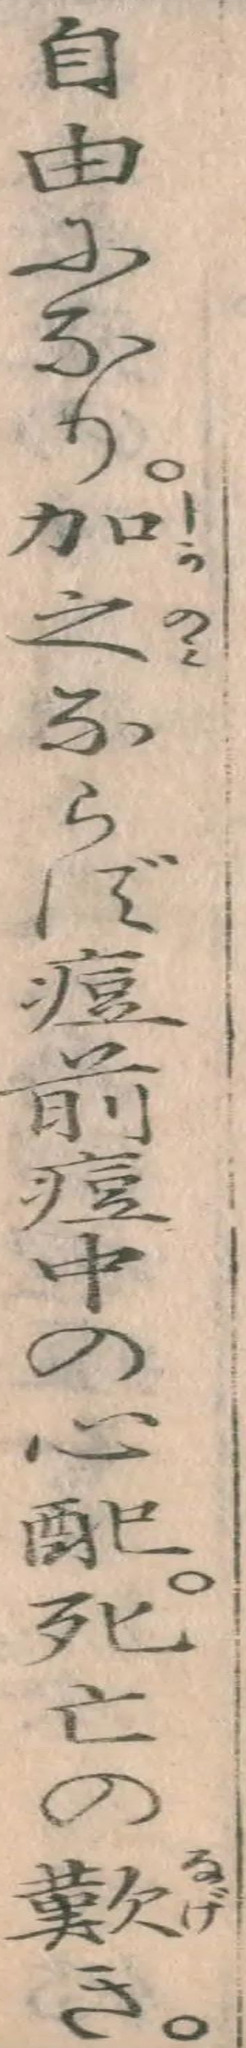自由になり。加之ならず痘前痘中の心配。死亡の歎き。
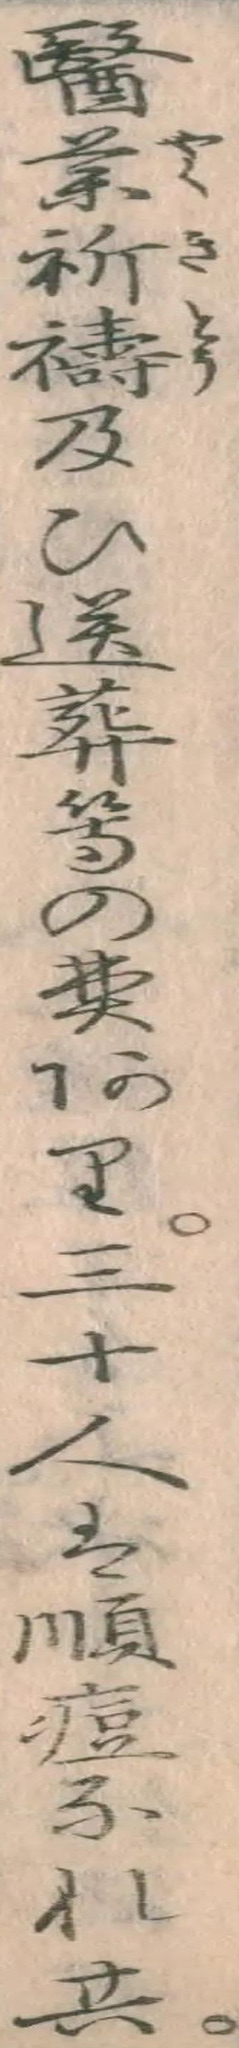医薬祈祷及ひ送葬等の費あり。三十人は順痘なれ共。
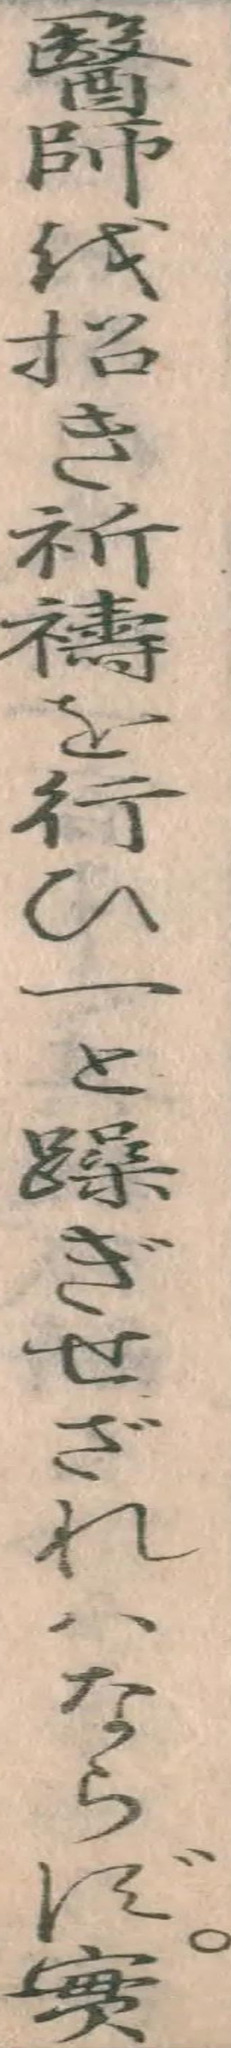医師を招き祈祷を行ひ一と躁ぎせざれはならず。実
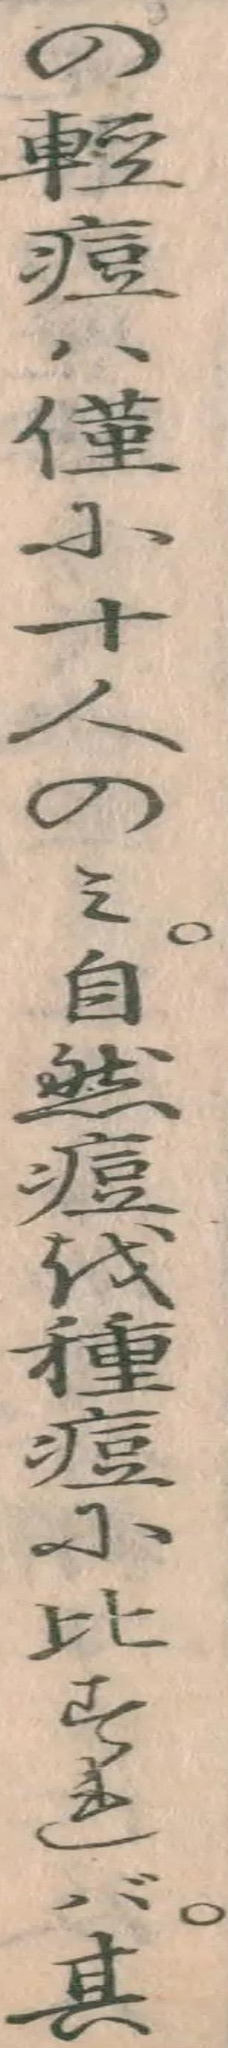の軽痘は僅に十人のみ。自然痘を種痘に比すれば。其
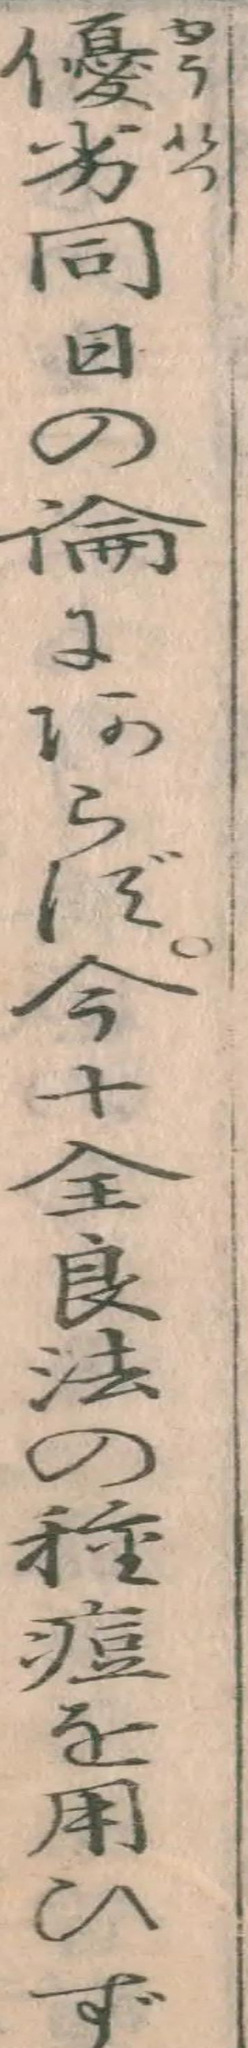優劣同日の論にあらず。今十全良法の種痘を用ひず
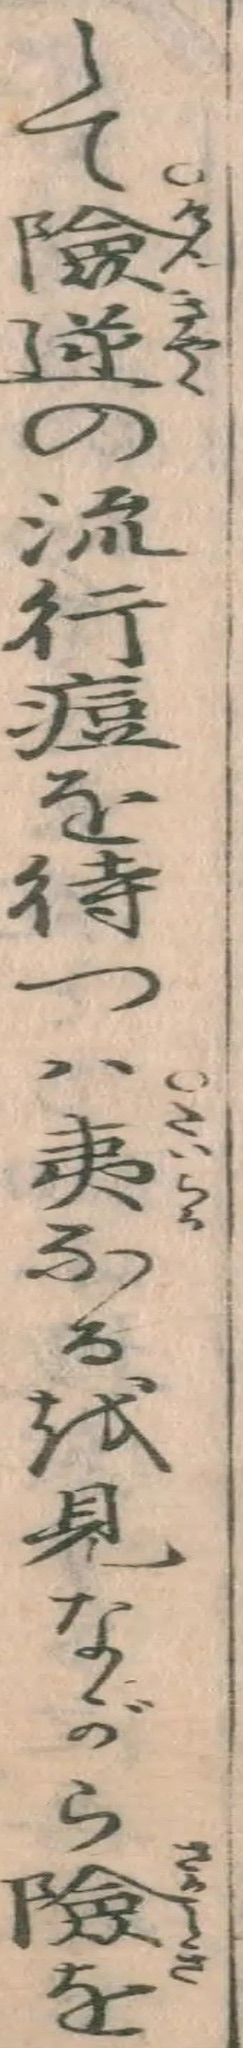して。険逆の流行痘を待つは。夷なるを見ながら険を
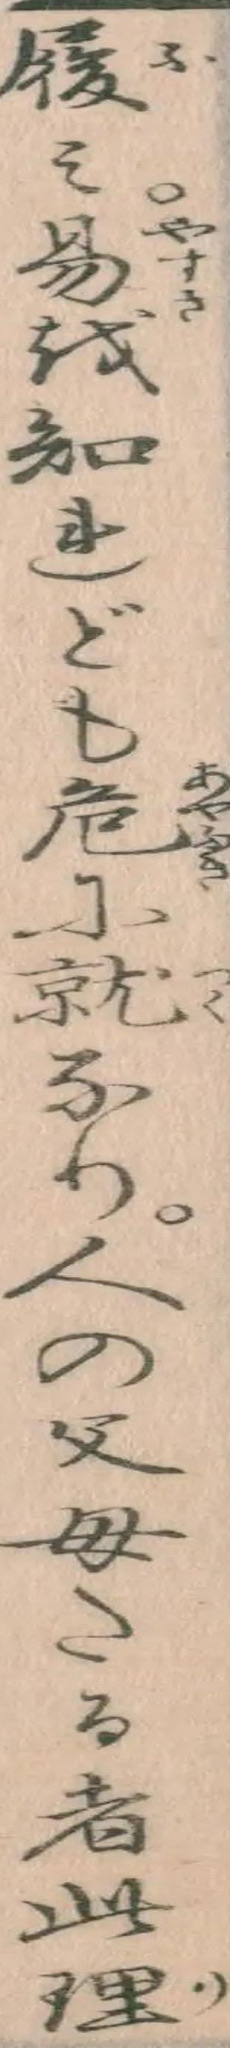履み。易を知れども危に就なり。人の父母たる者此理
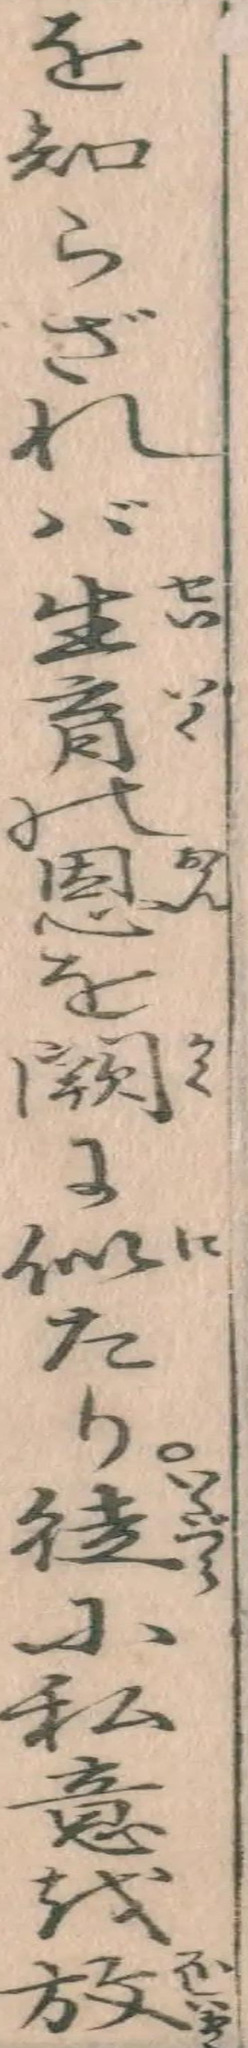を知らざれば生育の恩を闕に似たり。徒に私意を放
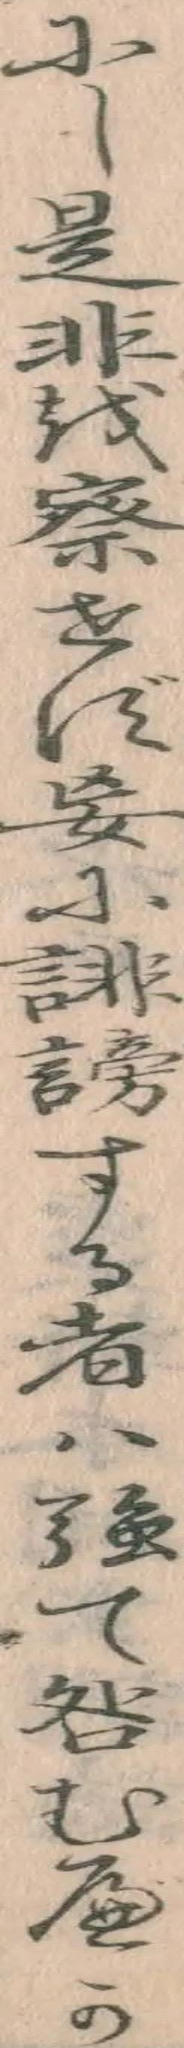にし是非を察せず。妄に誹謗する者は強て咎むべか
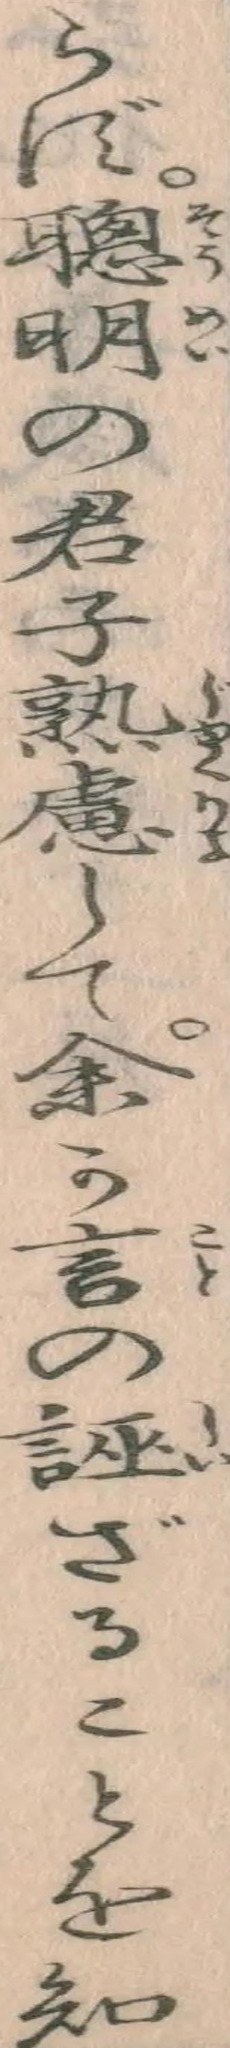らず。聡明の君子熟慮して。余か言の誣ざることを知
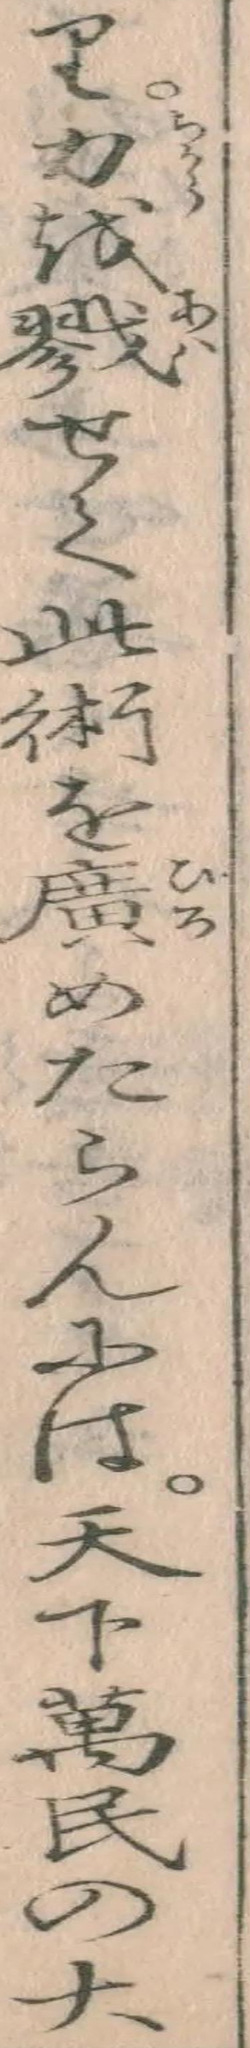り。力を戮せて此術を広めたらんには。天下万民の大
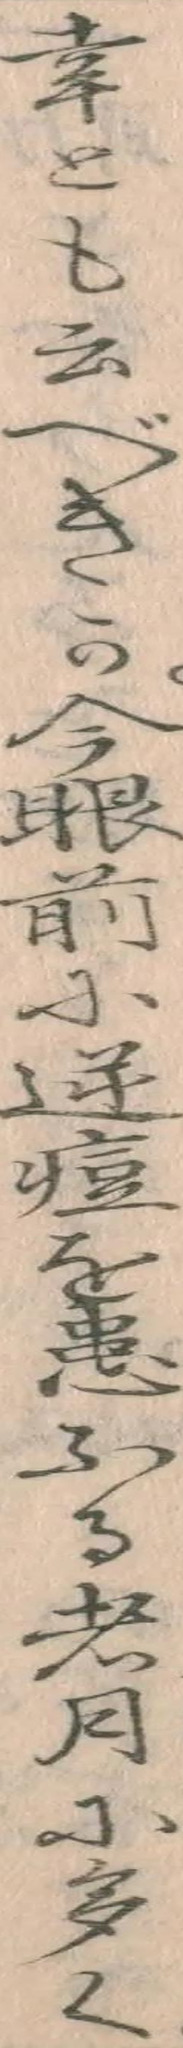幸とも云べきか。今眼前に逆痘を患ふる者月に多く。
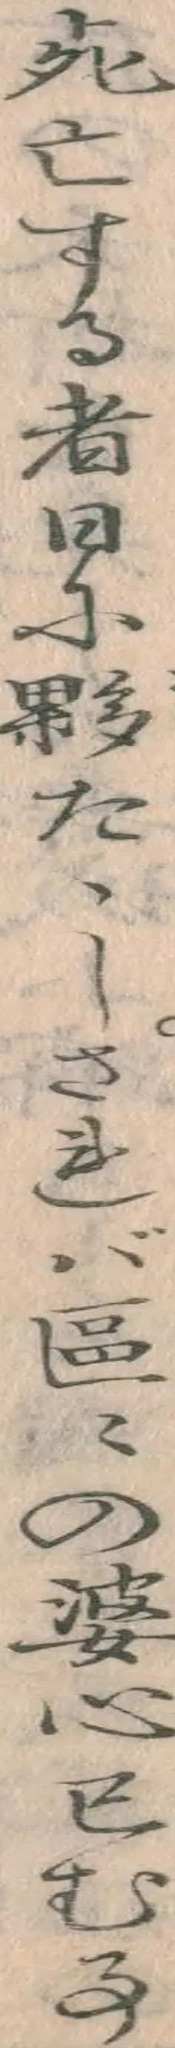死亡する者日に夥たゝし。されば区々の婆心已む事
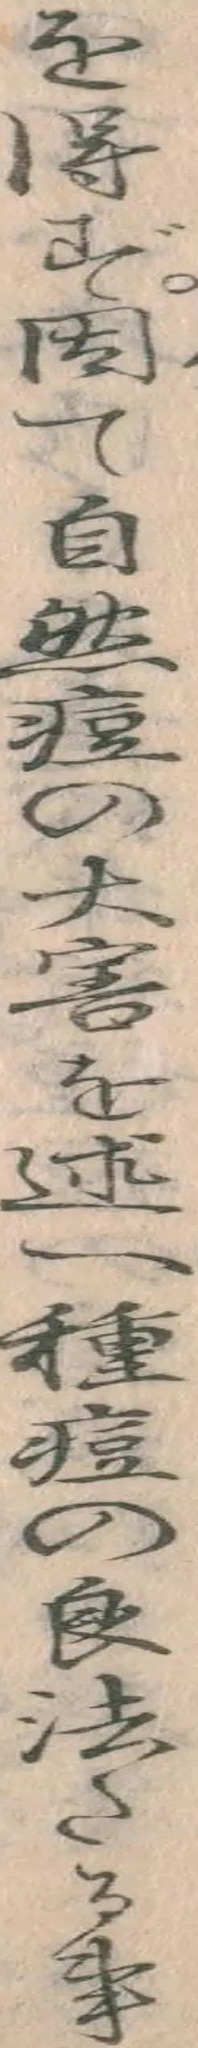を得ず。因て自然痘の大害を述へ。種痘の良法たる事
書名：種痘活人十全辯
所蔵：国立国会図書館 National Diet Library, JAPAN
